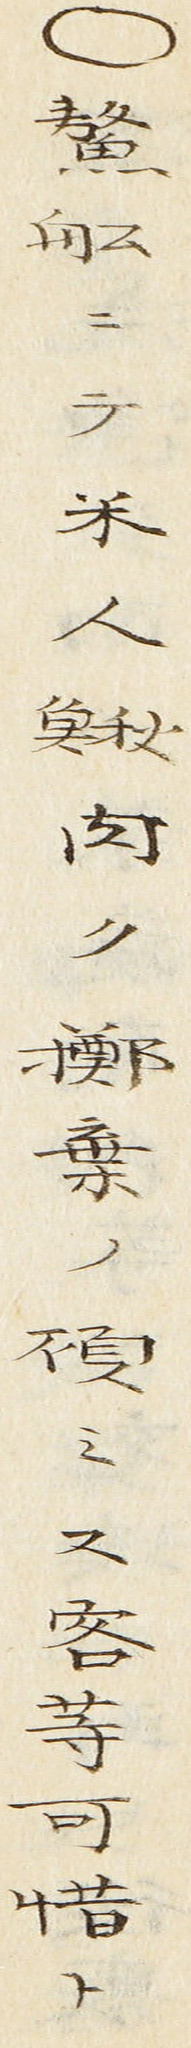〇鰲船ニテ米人鰍肉ク擲棄ノ顧？ミス客等可惜ト
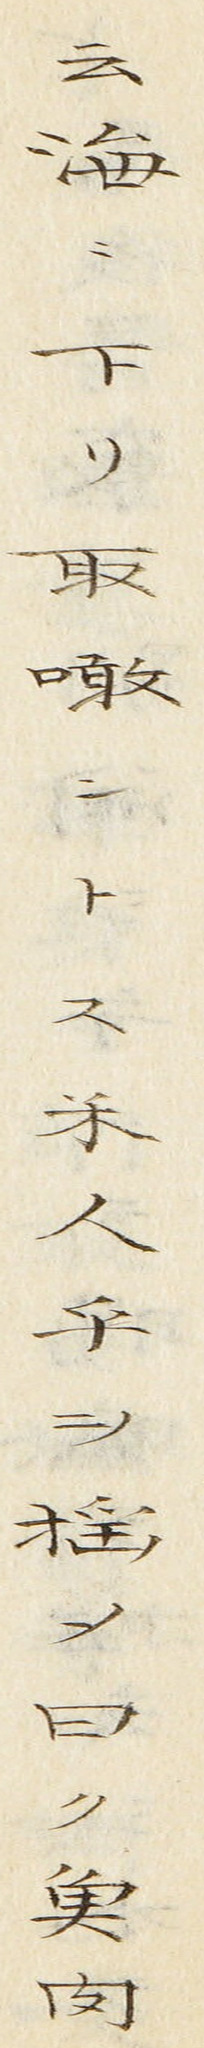云海ニ下リ取噉ントス米人乎ヲ揺シテ曰ク魚肉
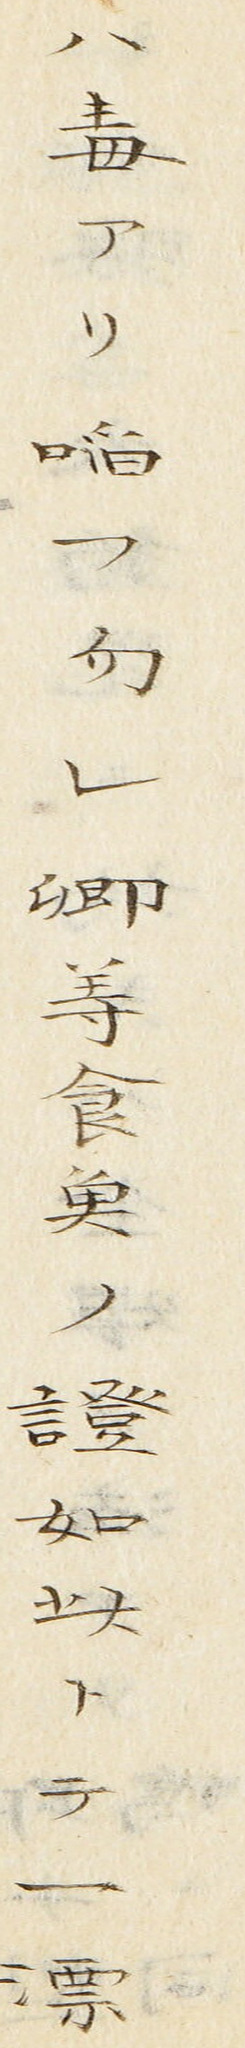ハ毒アリ㗖フ勿レ卿等食魚ノ証如此トテ一漂
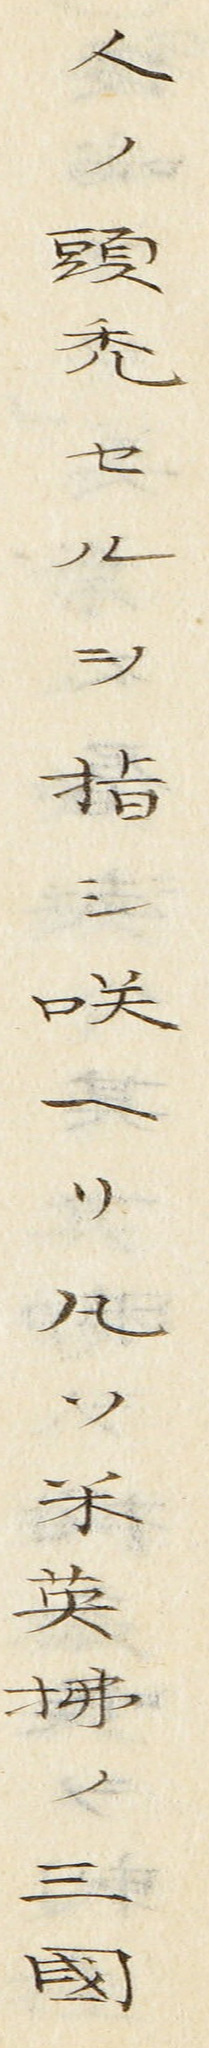人ノ頭禿セルヲ指シ咲ヘリ凡ソ米英拂ノ三国
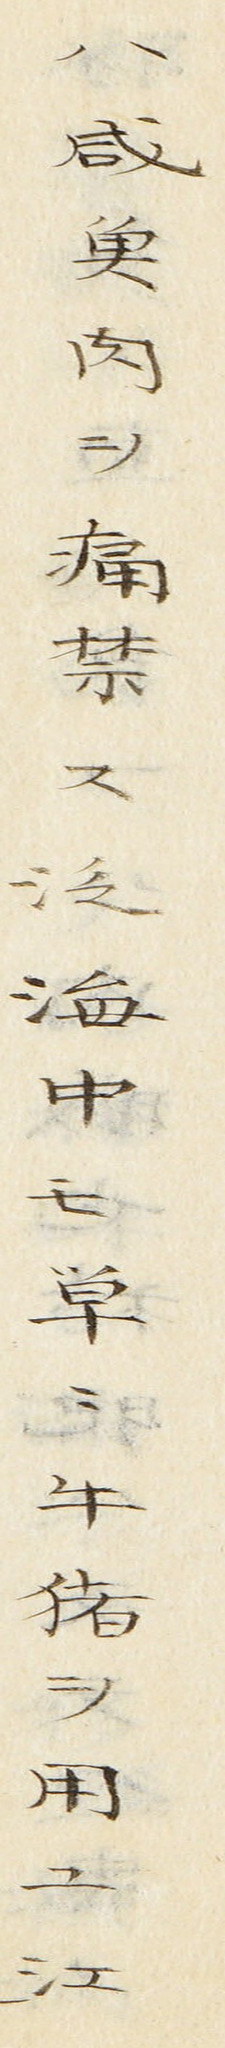ハ咸魚肉ヲ痛禁ス泛海中モ単〃牛猪ヲ用ユ江
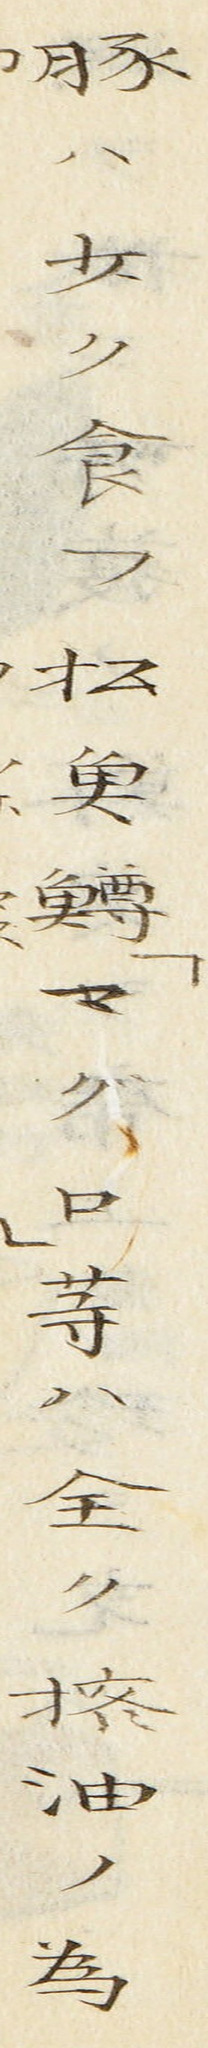豚ハ少ク食フ松魚鱒「マグロ」等ハ全ク揢油ノ為
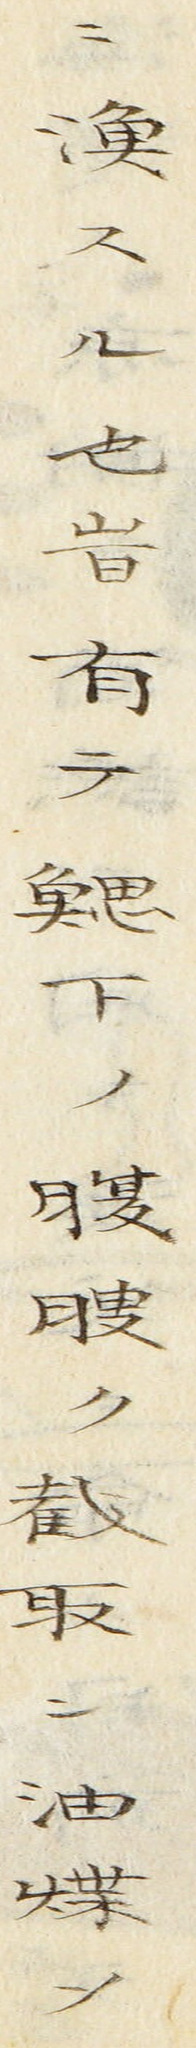ニ漁スル也旹有テ鰓下ノ腹膄ク截取ン油煠シテ
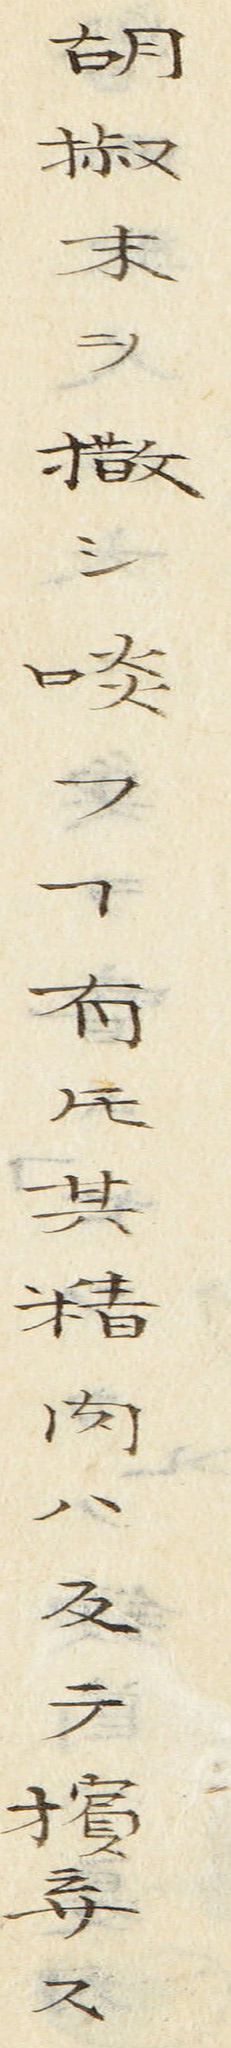胡椒末ヲ撒シ啖フコト有トモ其精肉ハ反テ擯弃ス

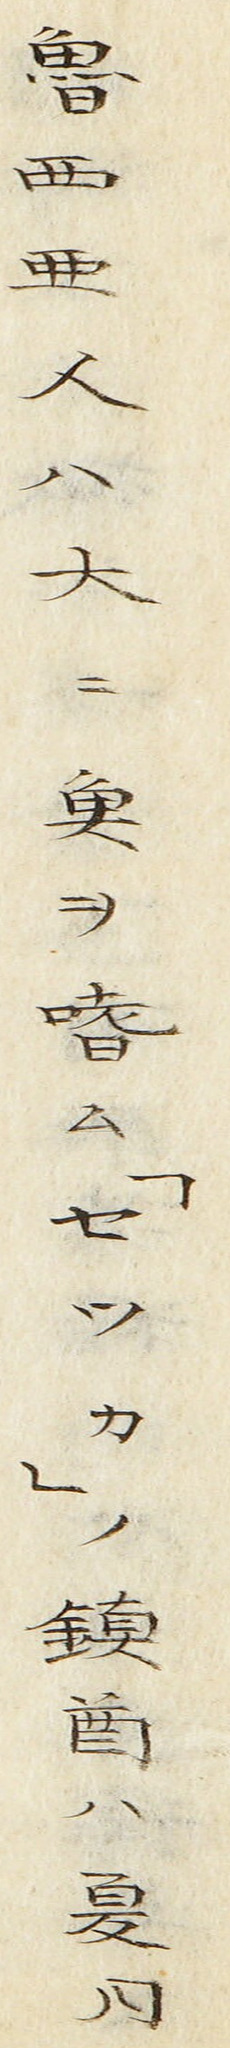魯西亜人ハ大ニ魚ヲ嗜ム「セツカ」ノ鎮酋ハ夏月
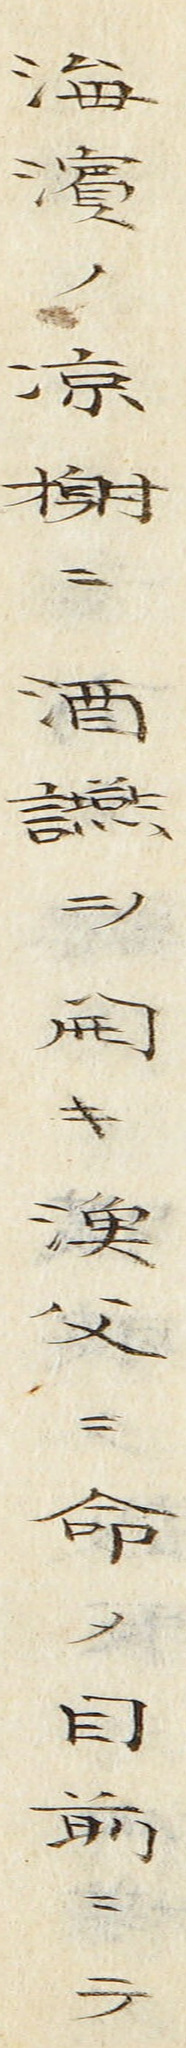海浜ノ凉榭ニ酒讌ヲ開キ漁父ニ命シテ目前ニテ
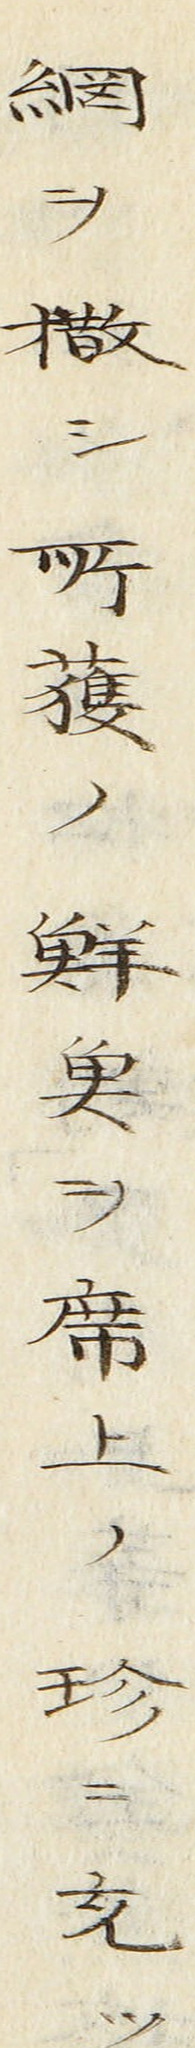網ヲ撒シ所獲ノ鮮魚ヲ席上ノ珍ニ充ツ
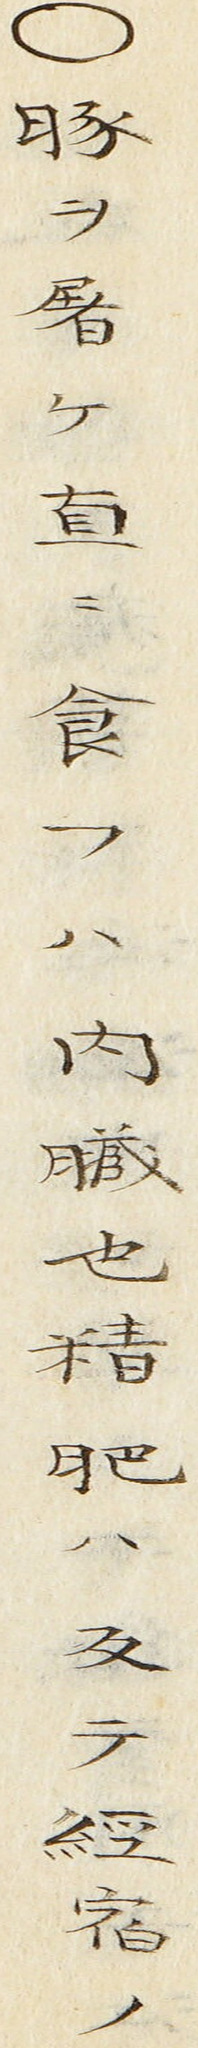〇豚ヲ屠ケ直ニ食フハ内臓也精肥ハ反テ経宿ノ
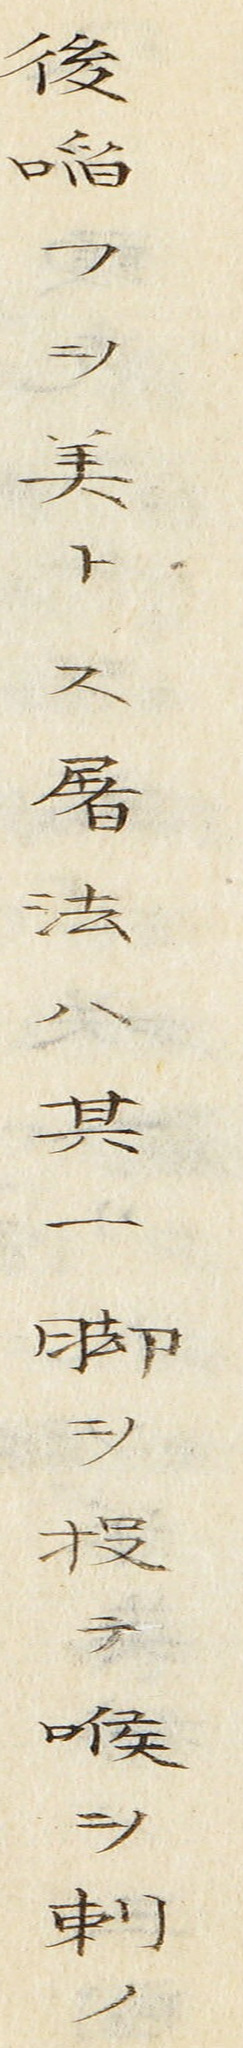後啗フヲ美トス屠法ハ其一脚ヲ投テ喉ヲ刺ノ
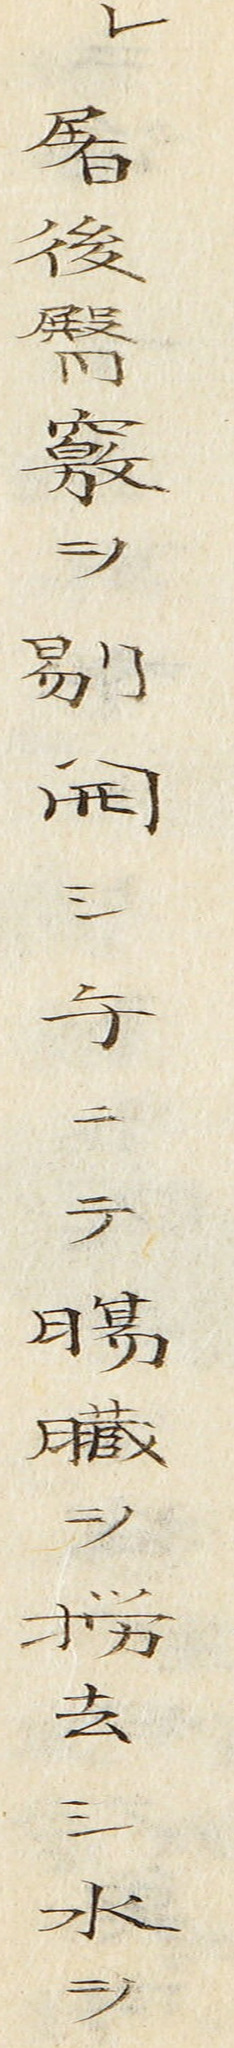レ屠後臀竅ヲ剔開シ手ニテ腸臓ヲ撈去シ水ヲ
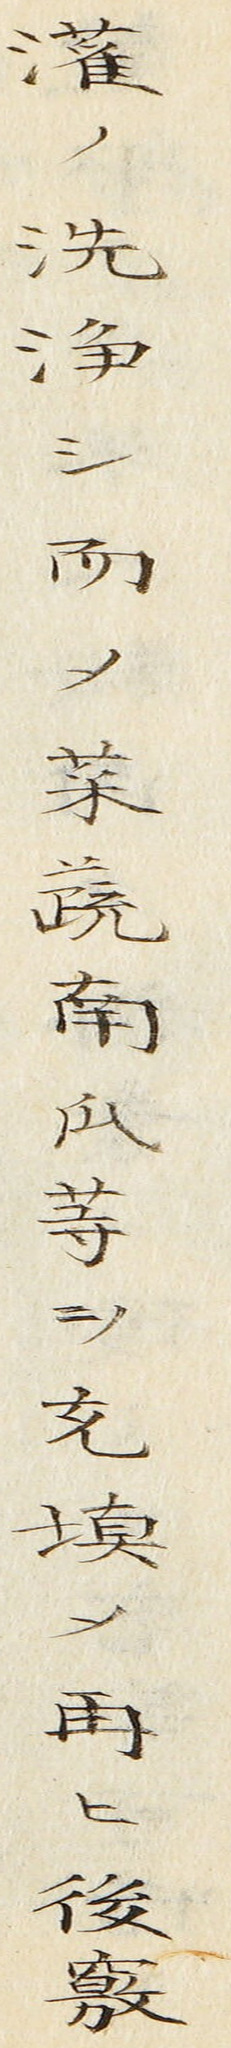灌ノ洗浄シ而シテ菜蔬南瓜等ヲ充填シテ再ヒ後竅
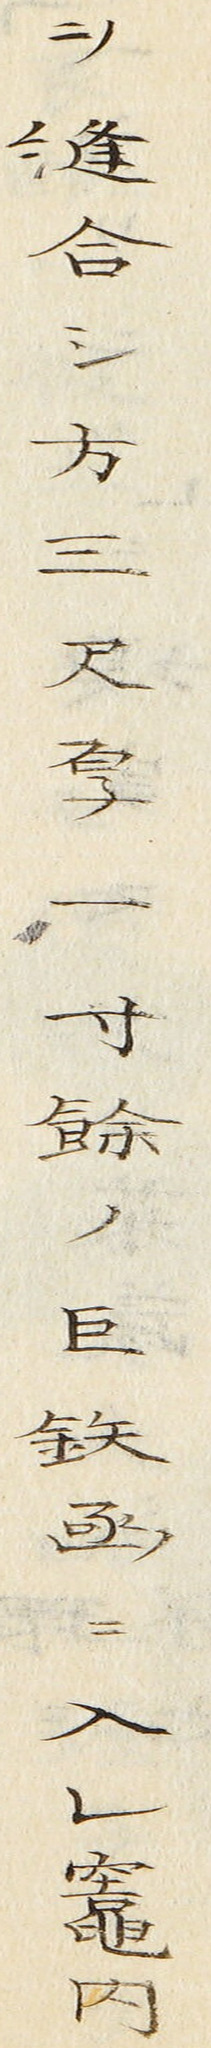ヲ縫合シ方三尺厚一寸余ノ巨鉄函ニ入レ竈内
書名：蕃談
